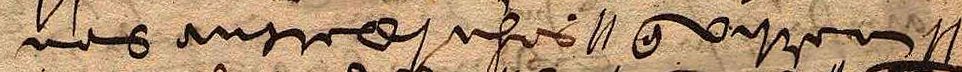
nas antrelljnhas // q̄ vyzem //
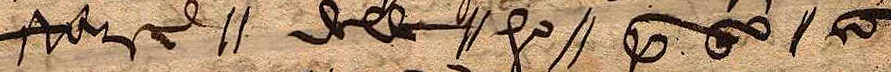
ffazē // delle // ho // p̄so // c̄o
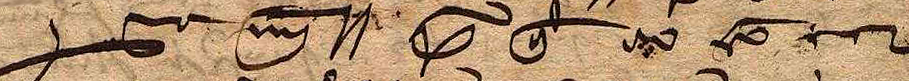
tra m̄j // p̄oq̄ ao c̄ocer
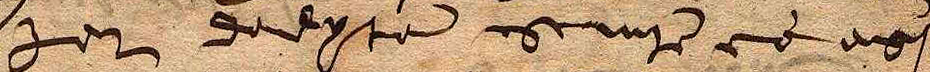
tar da dyta semtēça asy
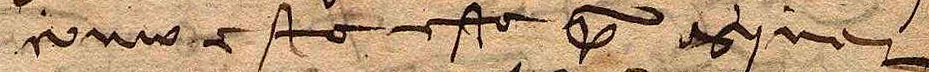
como esta esta p̄o asynar
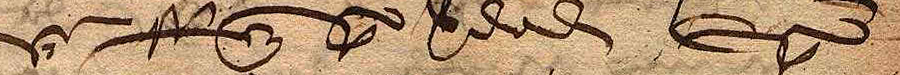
se ffez p̄o ꝟdade E p̄o
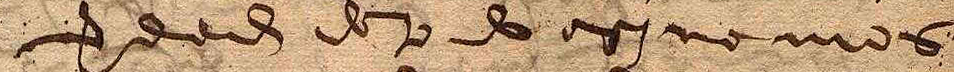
ꝟdade de todo asynamos
